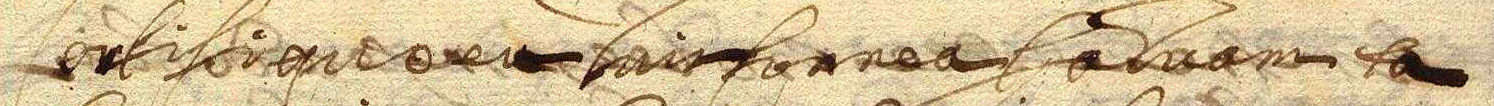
Certifiquo eu luiz Correa Galuam ta
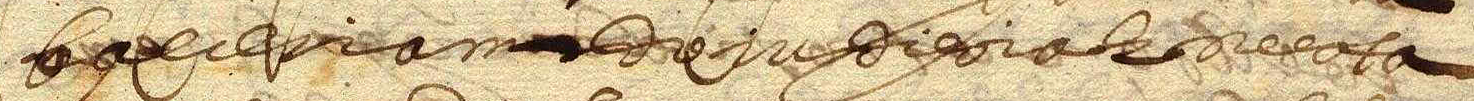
balliam do iudisial nesta
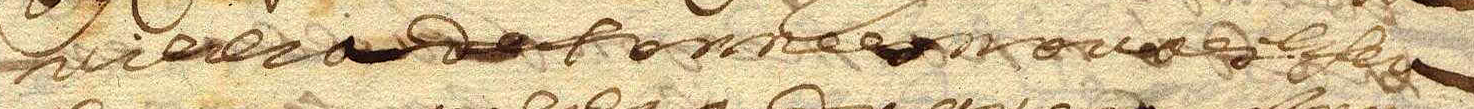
uilla de torres nouas E seu
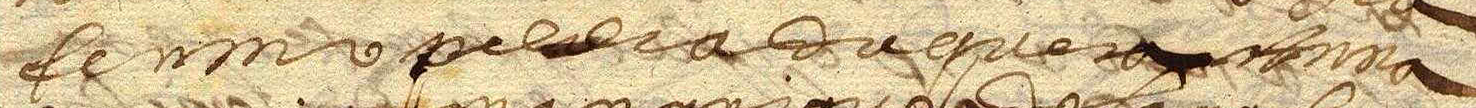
termo pella duqueza Anna
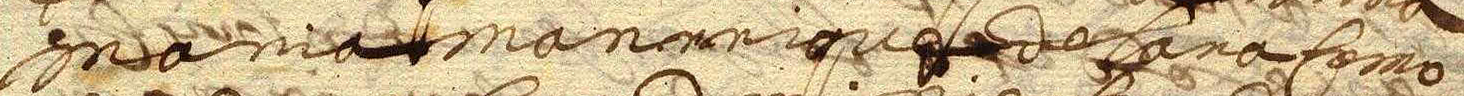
maria manrrique de lara Como
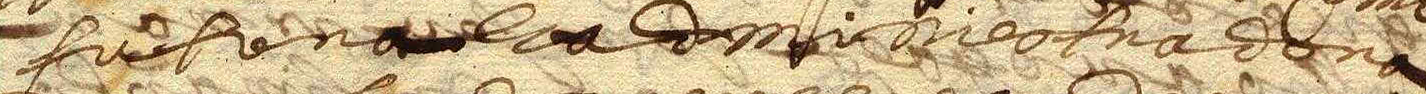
tutora E administradora
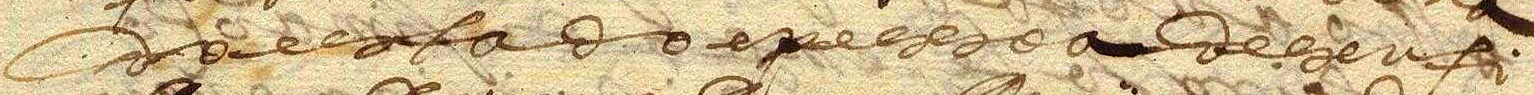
do estado e pessoa de seu fi
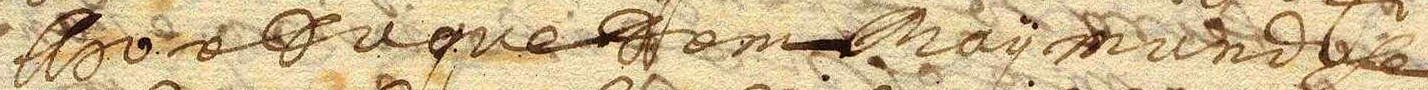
lho o Duque Dom Raymundo se
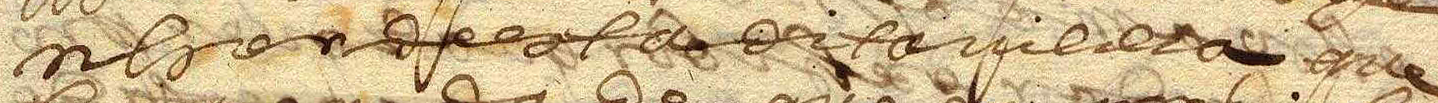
nhor desta dita uilla que
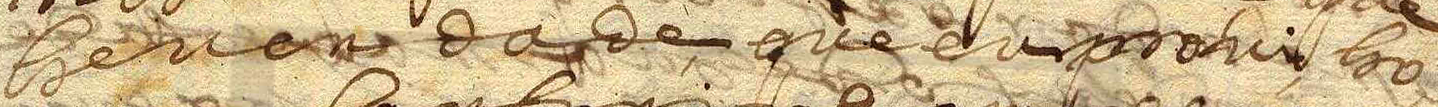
he uerdade que eu proui ho
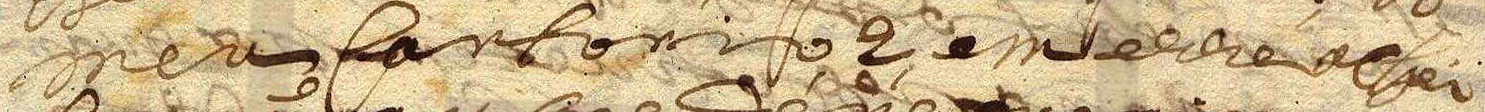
meu Cartorio E em elle achei
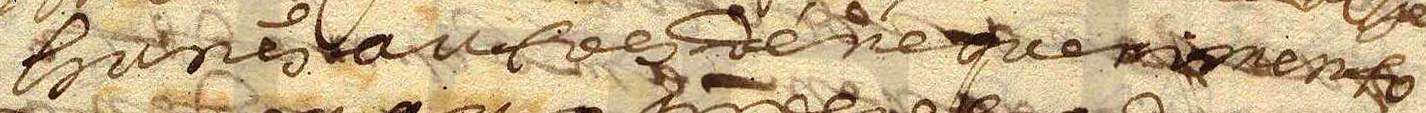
huns̄ autos de requerimento
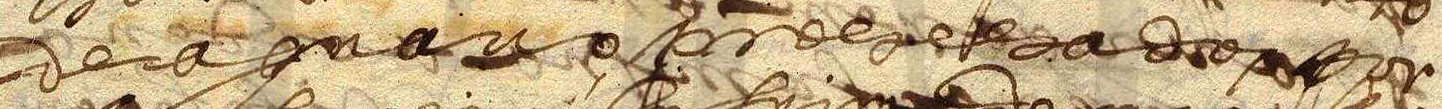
de agrauo prosesados por
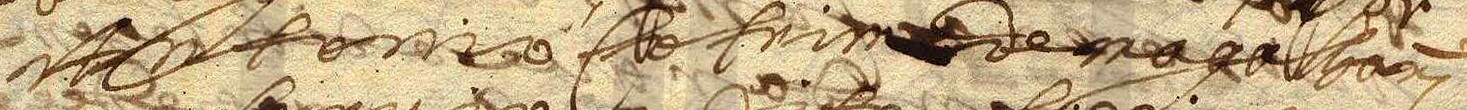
Antonio Cotrim de magalhans̄
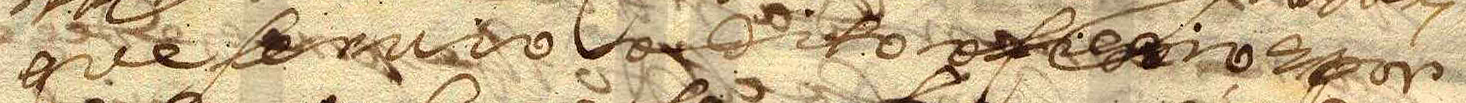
que seruio o dito ofisio E por
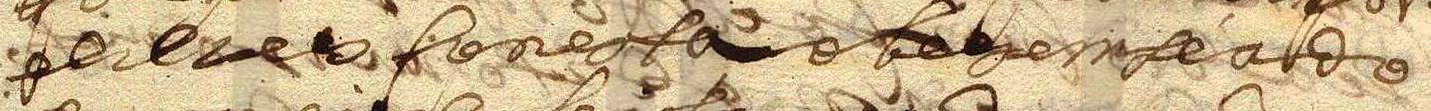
elles Consta o lesemseado
